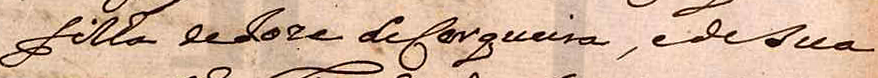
filha de Ioze de Cerqueira, e de sua
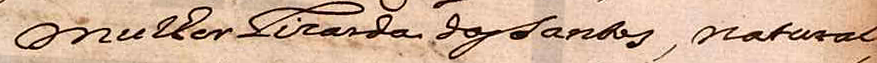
mulher Lizarda dos santos, natural
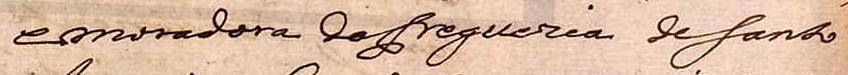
e moradora da freguezia de santo
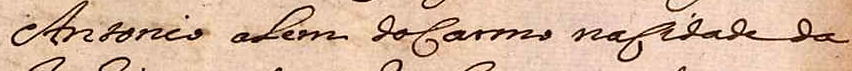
Antonio alem do Carmo na Cidade da
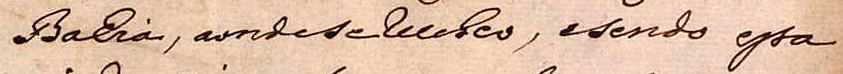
Bahia, aonde se Recebeo, e sendo esta
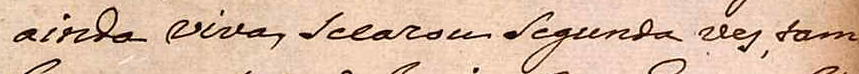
ainda viva, se cazou segunda ves, tam
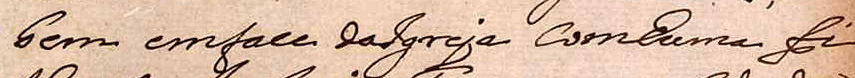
bem em face da Igreja com huma fi
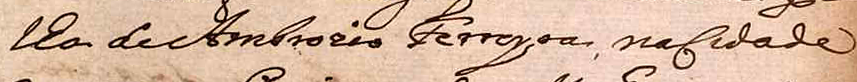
lha de Ambrozio Ferreyra, na Cidade
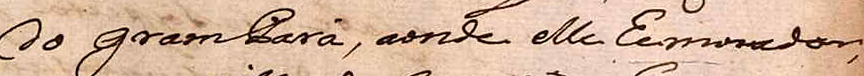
do gram Pará, aonde elle he morador,
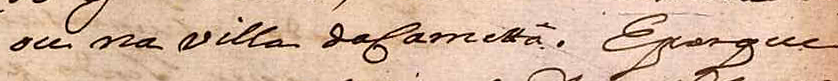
ou na villa da Camettâ. E porque
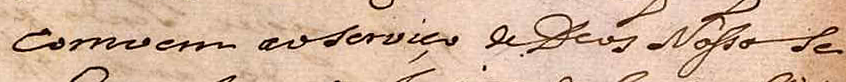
comvem ao serviço de Deos Nosso se
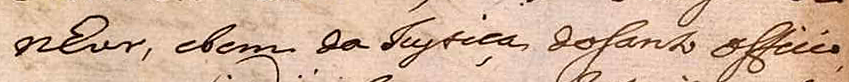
nhor, e bem da Iustiça do santo officio
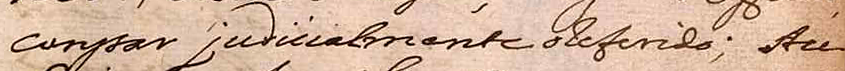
constar judicialmente o Referido; Au
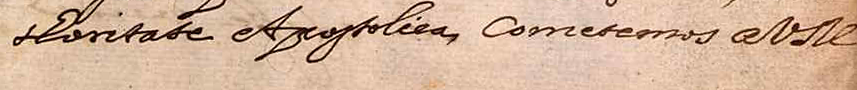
thoritate Apostolica, cometemos a VM
